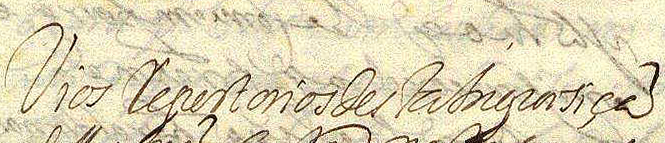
Vi os Reportorios desta Inquisiçaõ
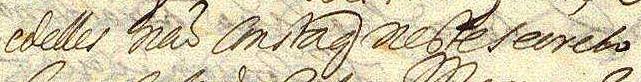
e delles naõ consta q̄ neste secreto
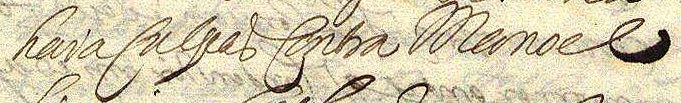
haia Culpas Contra Manoel
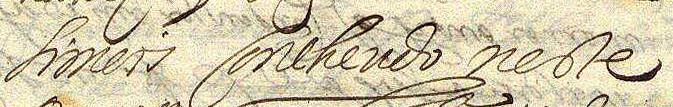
Simois Contheudo neste
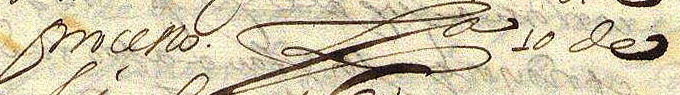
processo. LXa 10 de
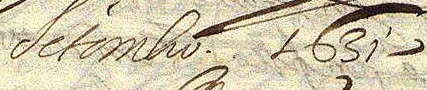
Setembro. 163i -
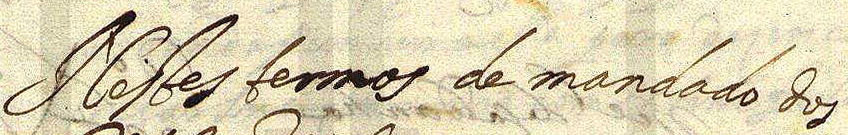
Nestes termos de mandado dos
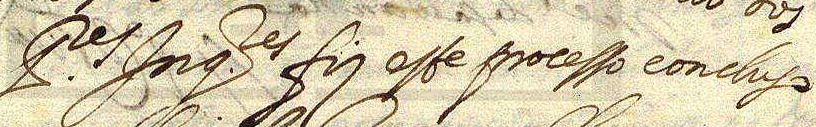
s.res Jnq.res fiz este processo concluso
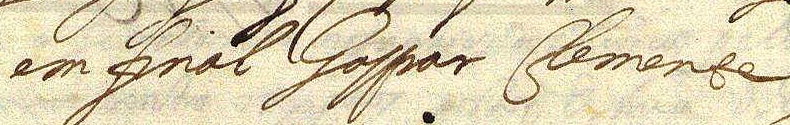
em final Gaspar Clemente
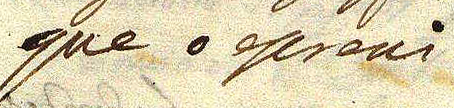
que o escreui
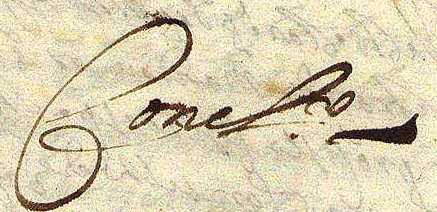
Concl.o
